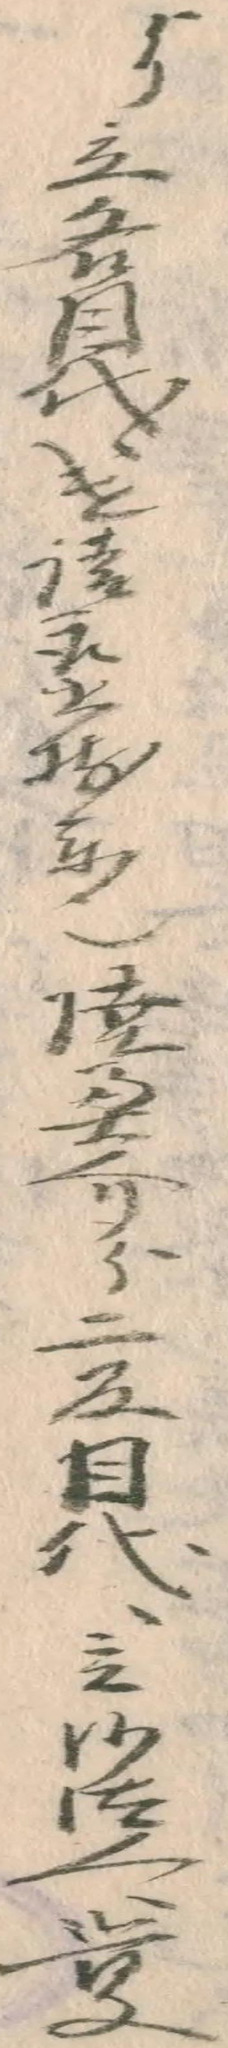より立各目代へ遣請取書持参也陸奥介分二反目代へ立沙汰人へ弐百文
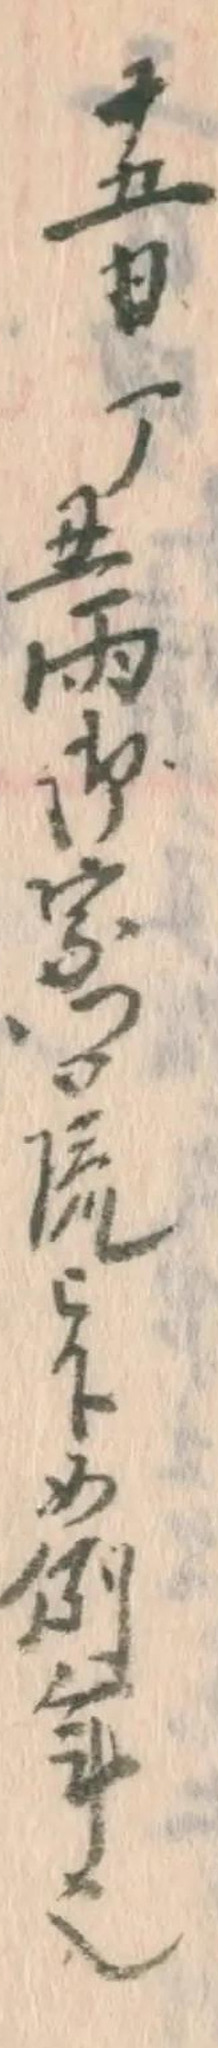十五日丁丑雨御家門御流被下如例年也
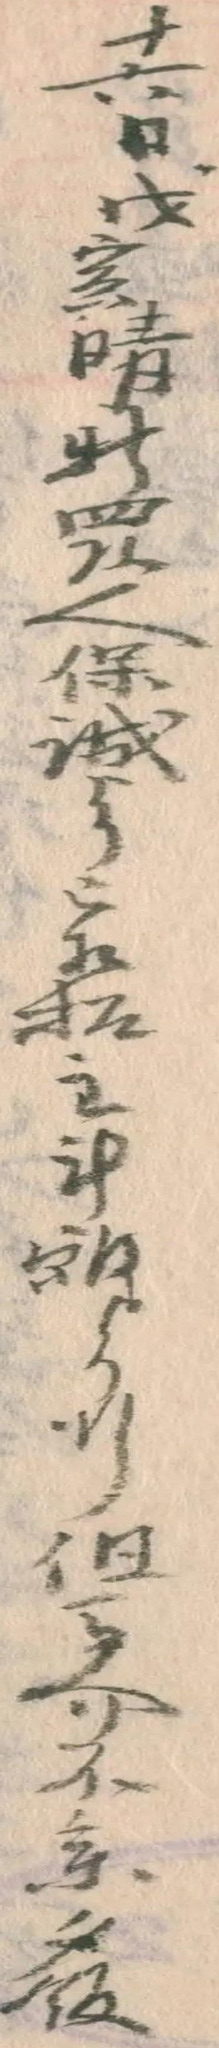十六日戌亥晴新四頭人保誠より被相招主斗朝より行但馬介不参夕飯
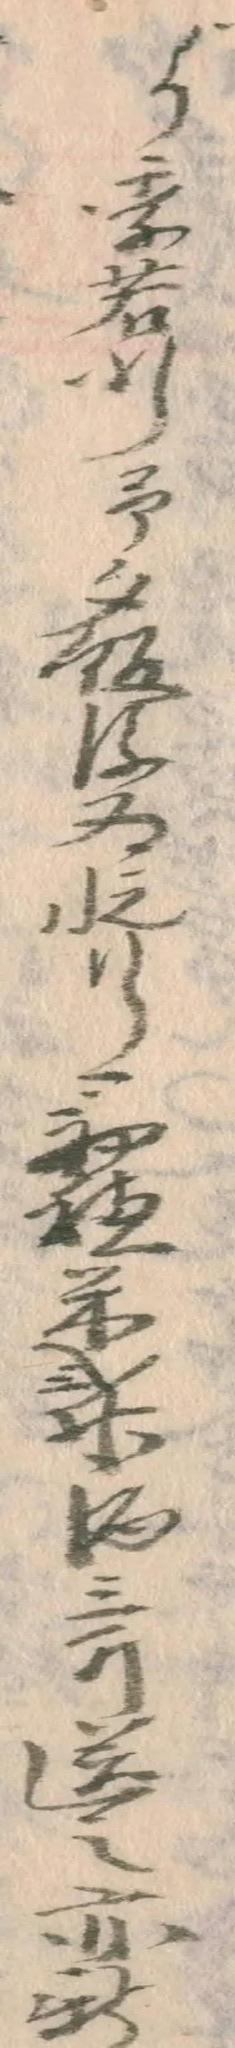より季若行予夕飯後為祝行御初穂米弐升酒三升送之亦新
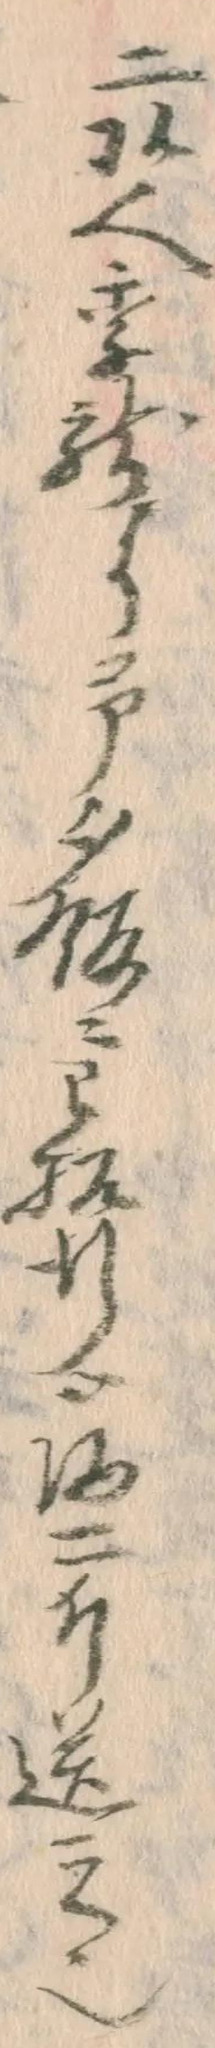二頭人季新より予夕飯に已招行御酒二升送之也
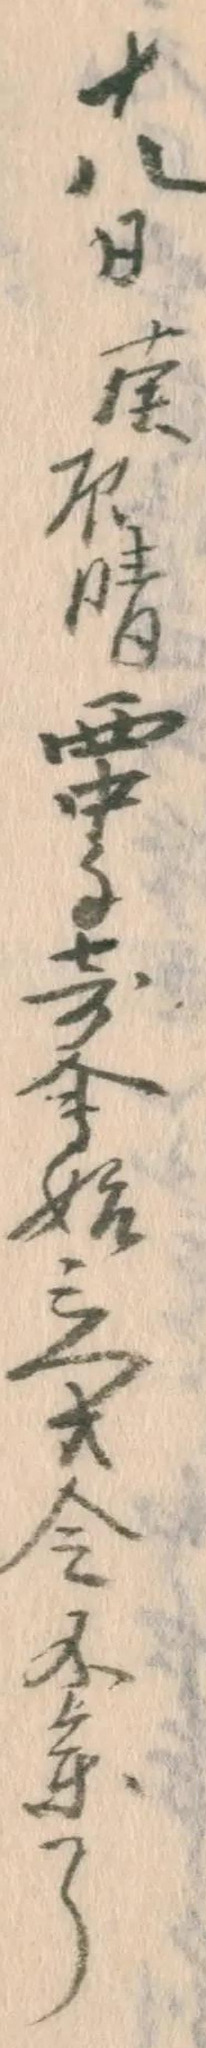十八日庚辰晴西中手寄會始三人共令不参了
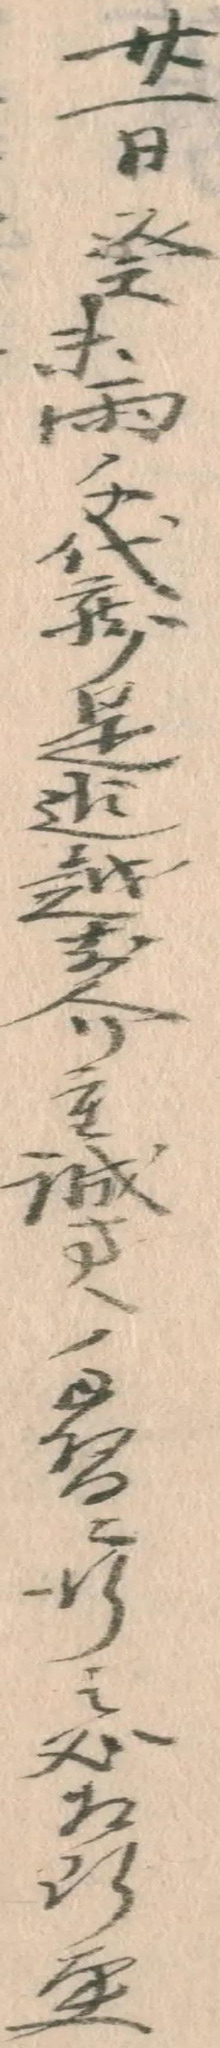廿一日癸未雨手代蔵是迄越前介重誠方へ手習に行之処相断更
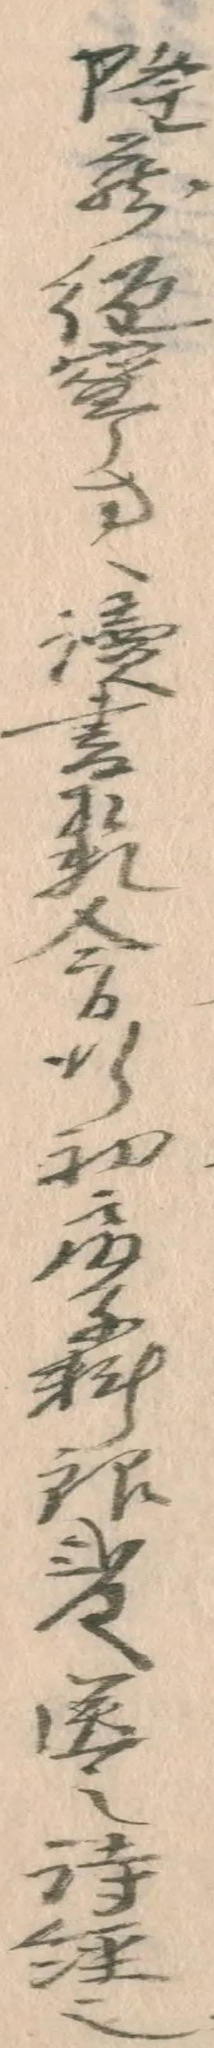隆蔵経寧方へ讀書相頼今日行初扇子料銀弐匁送之詩経也
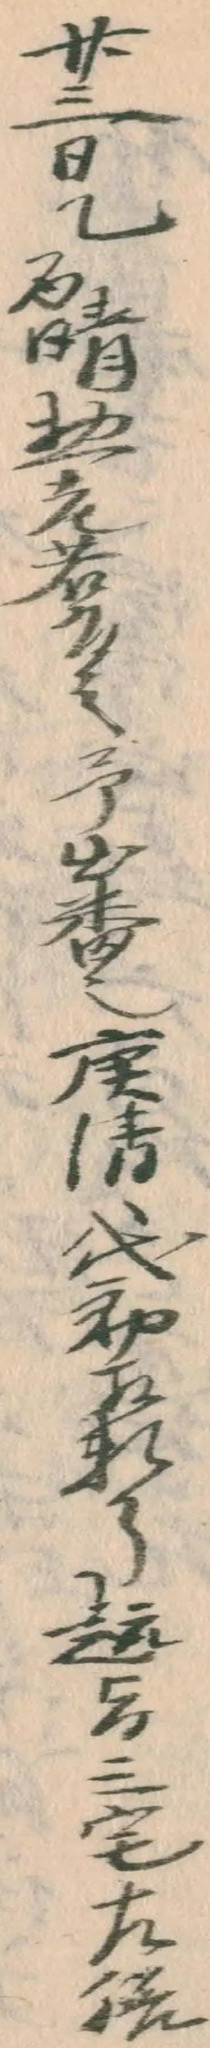廿三日乙酉晴惣老若有之予出番也庚清ヘ代勤相頼了趣旨三宅左膳
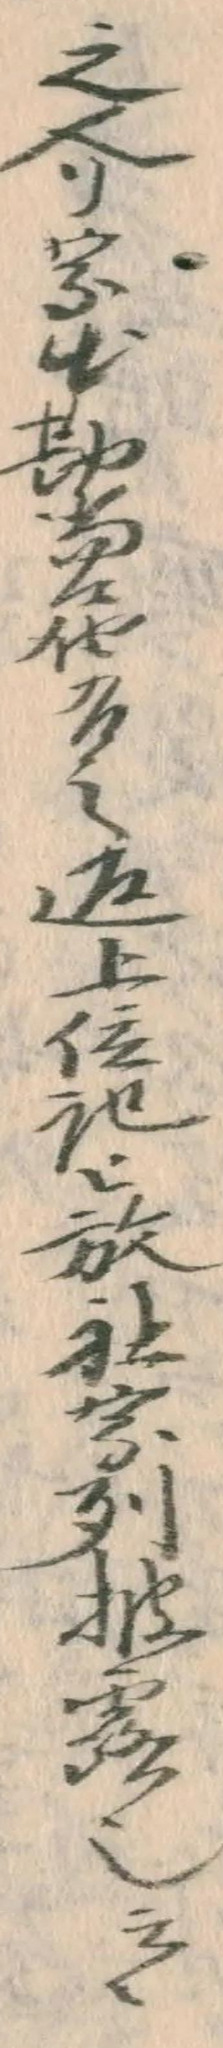之介家出勘当届有之返上位記被放社家列披露也云々
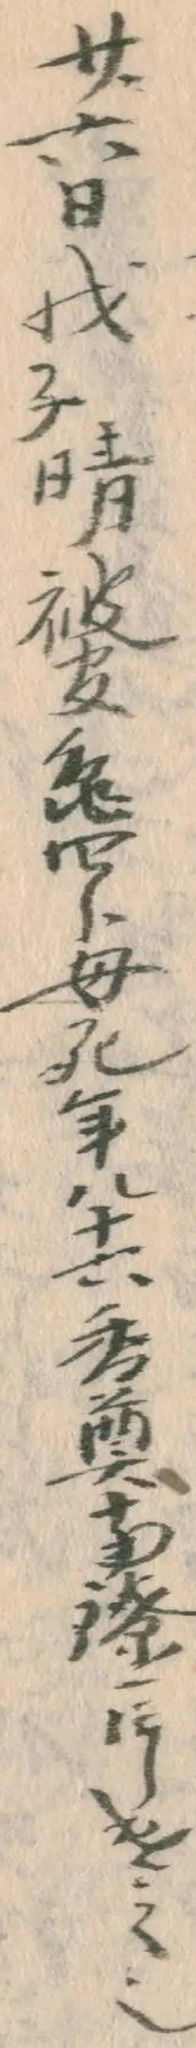廿六日戊子晴被官亀四郎母死年八十六香奠南鐐一片遣之了
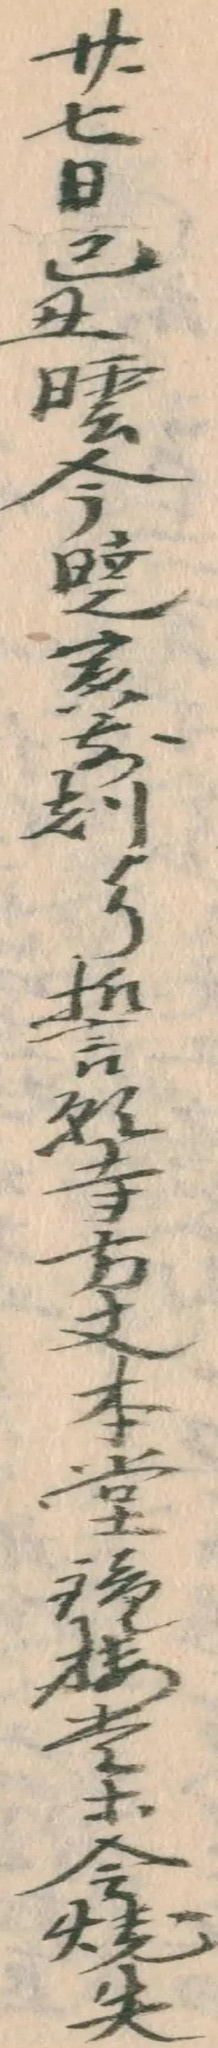廿七日己丑曇今暁寅前刻より誓願寺方丈本堂鐘楼堂等令焼失
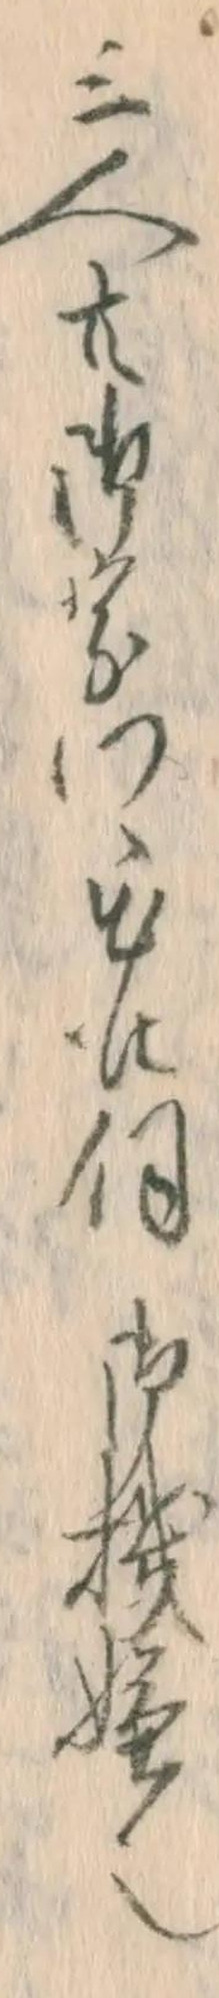三人共御家門へ出仕伺御機嫌也
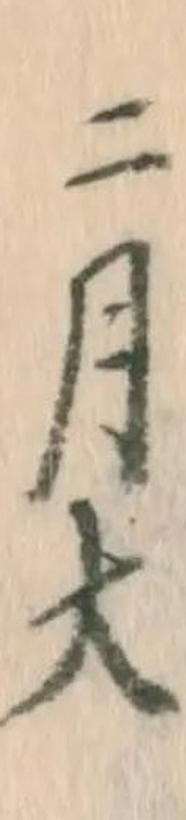二月大
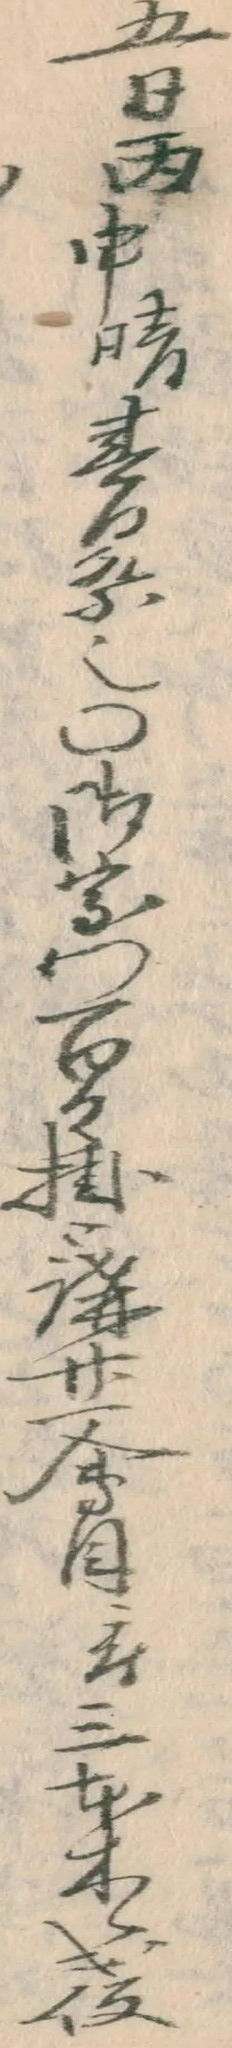五日丙申晴春日祭也○御家門百匁掛御講廿一會目ニ付三本木へ出役
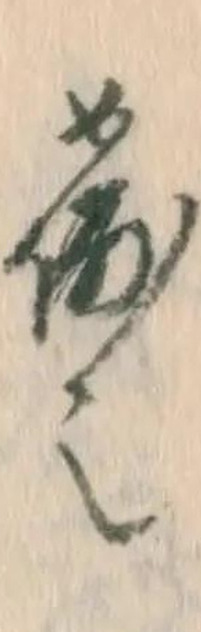如例也
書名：賀茂社記録. 第70冊
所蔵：国立国会図書館 National Diet Library, JAPAN
